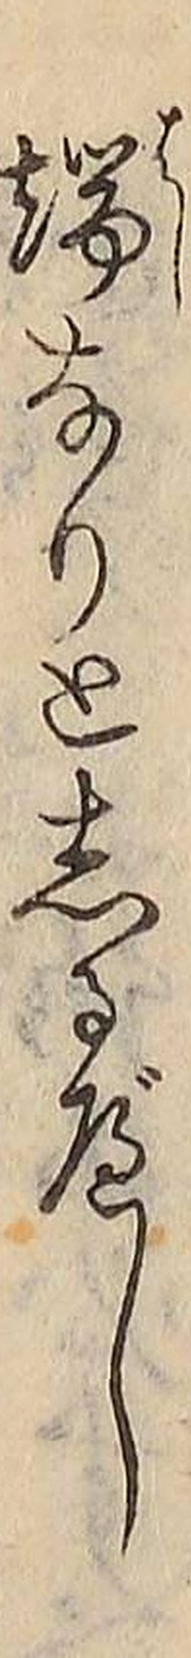端なりとしるべし
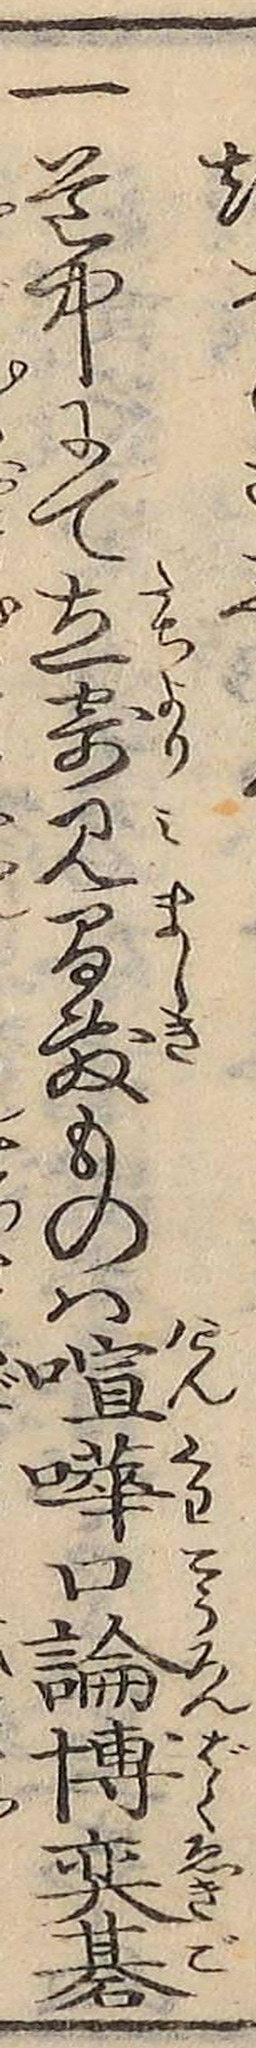一道中にて立寄見間敷ものは喧嘩口論博奕碁
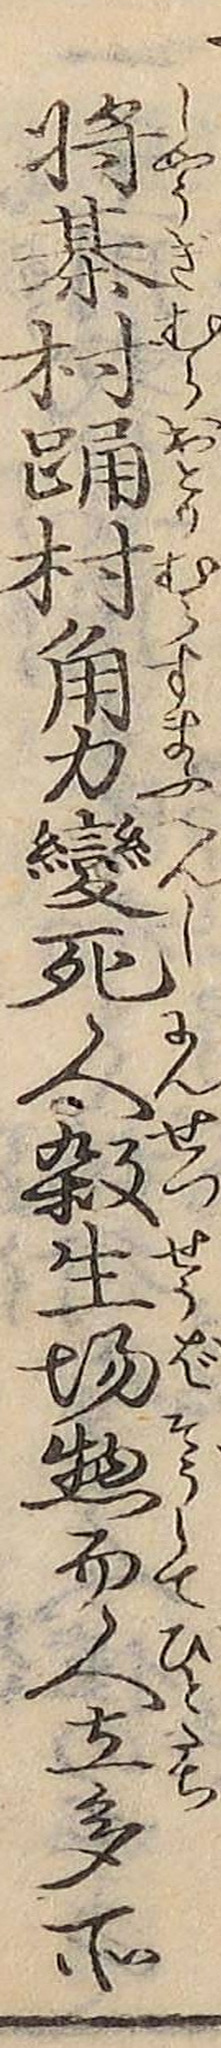将棊村踊村角力変死人殺生場惣而人立多所
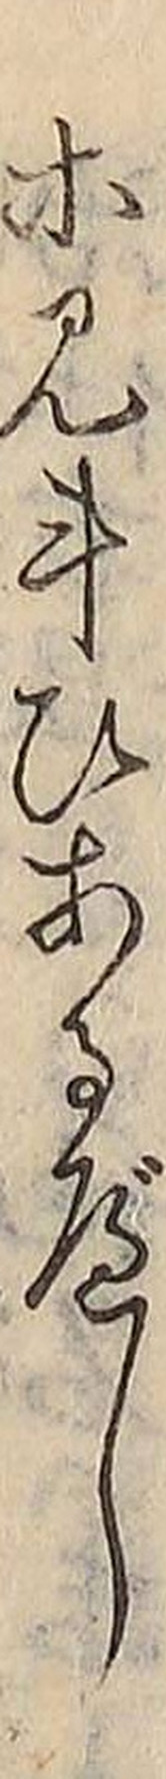等見計ひあるべし
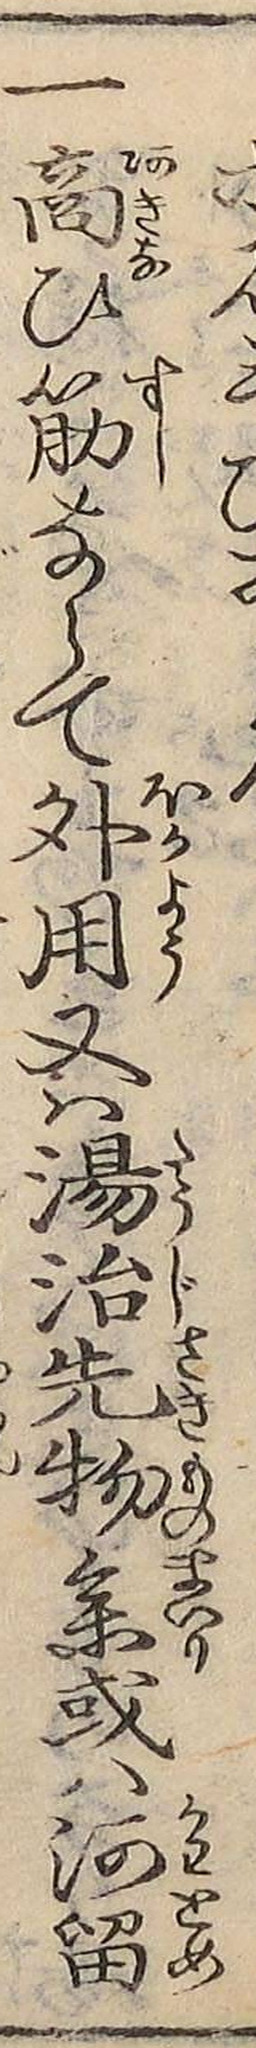一商ひ筋ならて外用又は湯治先物参或は河留
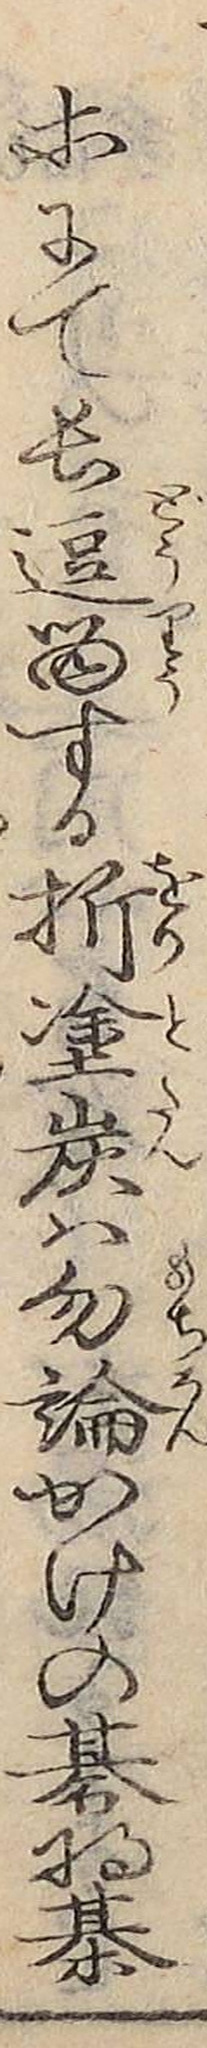等にて長逗留する折塗炭は勿論かけの碁将棊
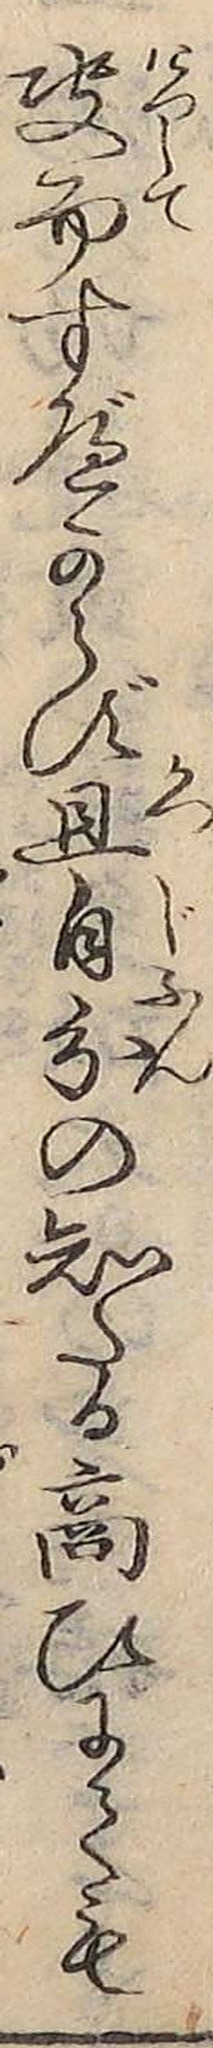決而すべからず且自分の知たる商ひにても
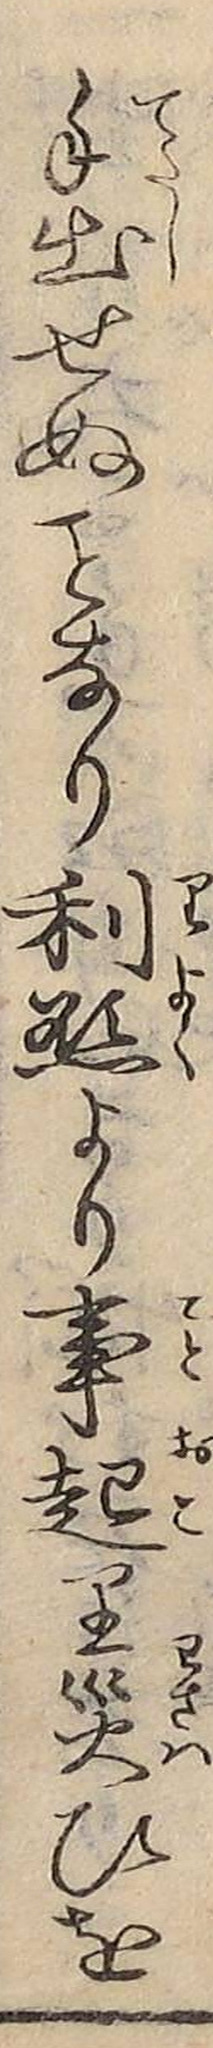手出せぬことなり利慾より事起り災ひを

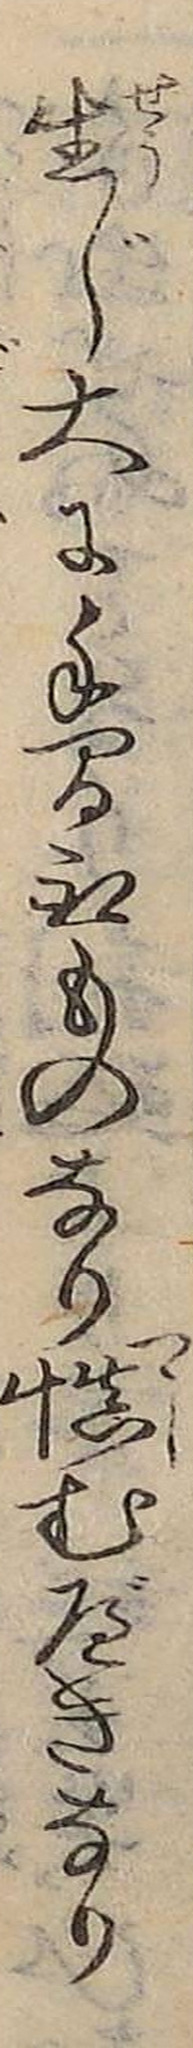生じ大に手間取ものなり慎むべきなり
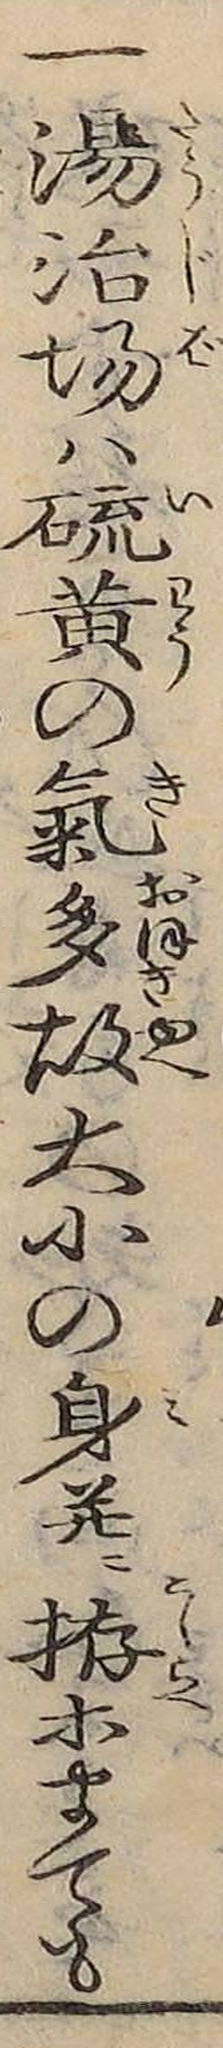一湯治場は硫黄の気多故大小の身并拵等まても
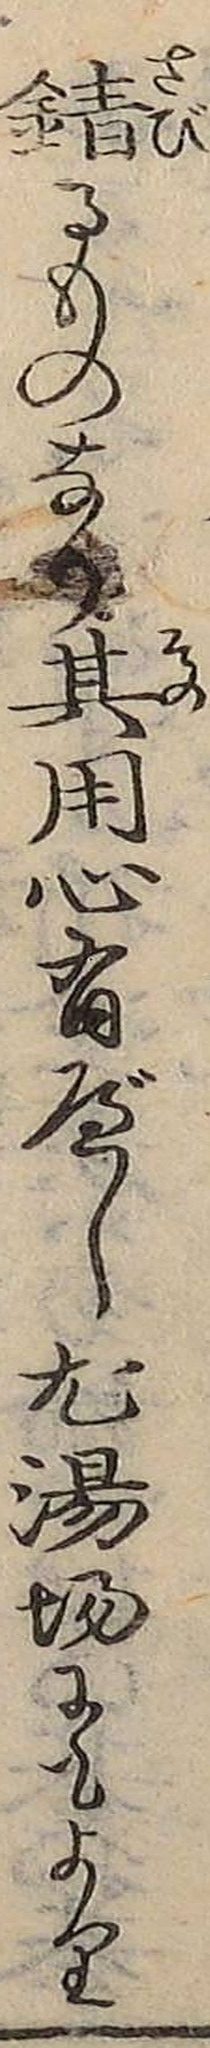錆るものなり其用心有べし尤湯場にもより
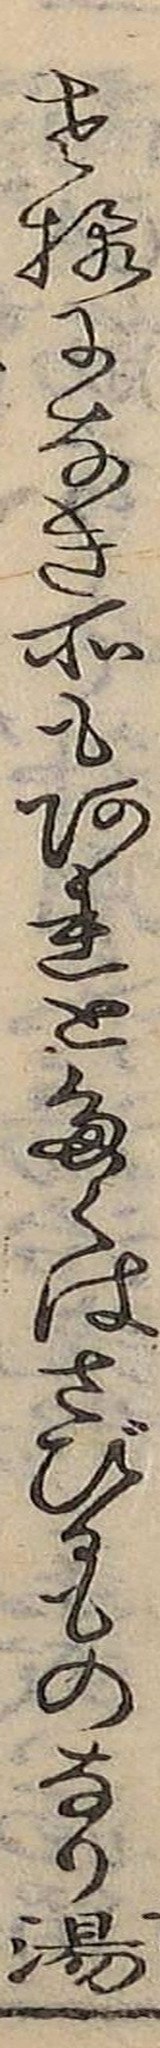さ様になき所もあれと多くはさびるものなり湯
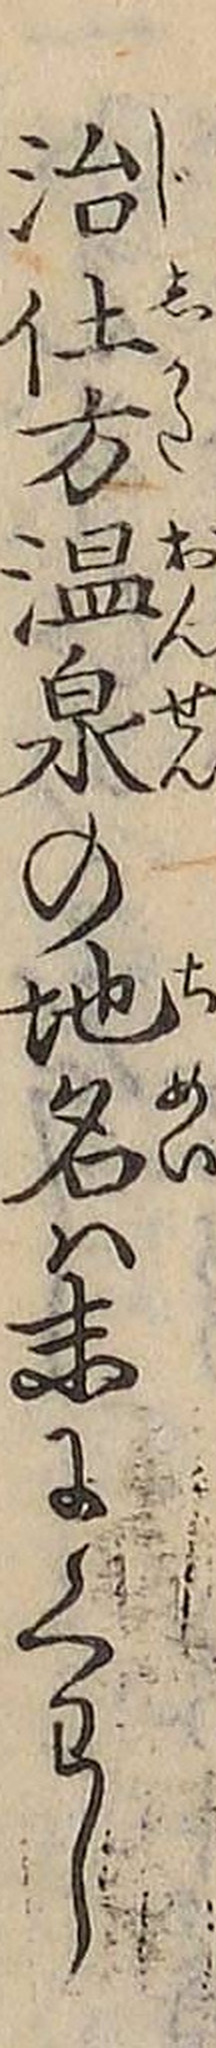治仕方温泉の地名は末にくわし
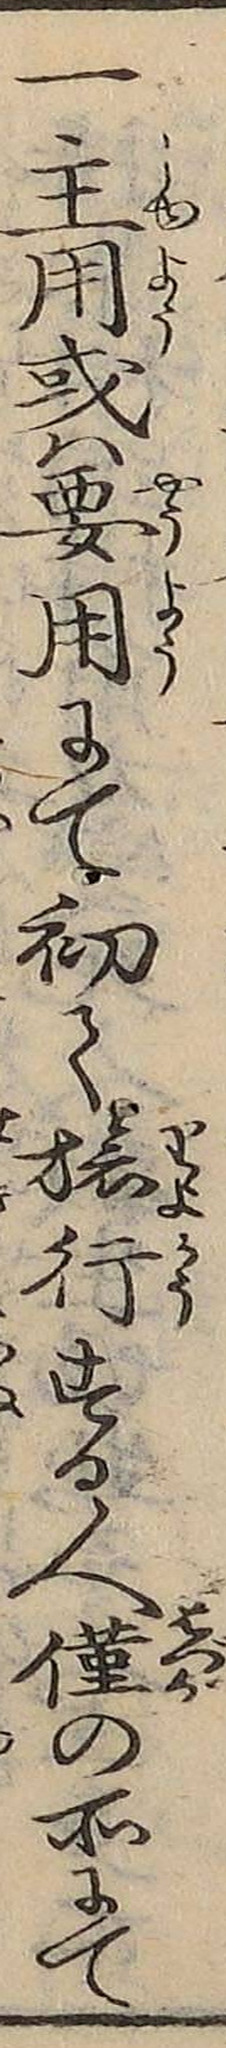一主用或は要用にて初て旅行する人僅の所にて
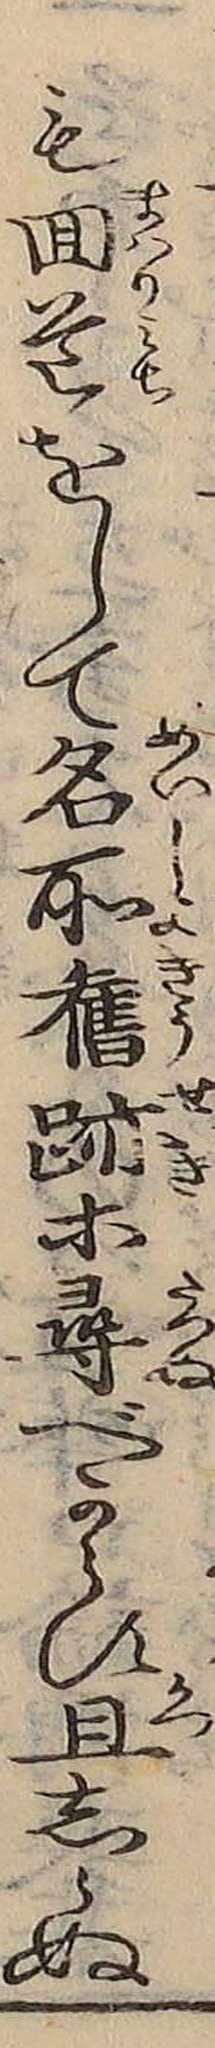も回道をして名所旧跡等尋べからす且しらぬ
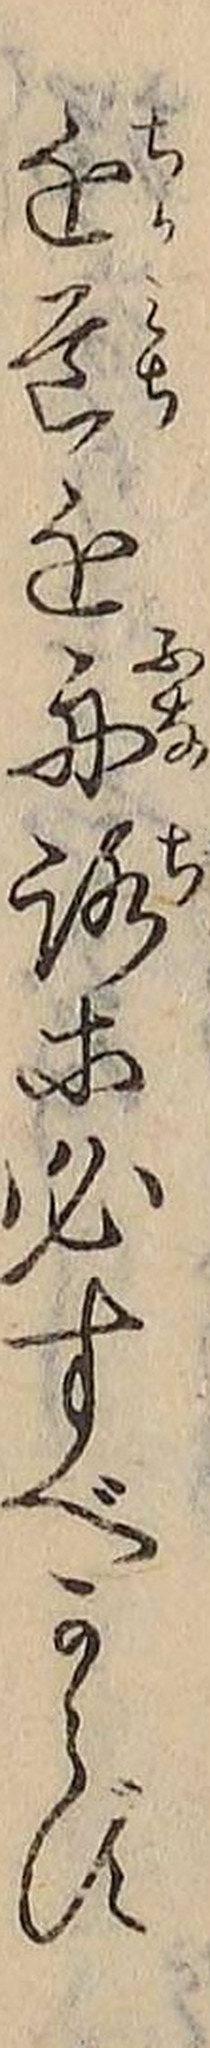近道近舟路等必すべからず
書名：旅行用心集
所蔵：神戸大学附属図書館 国文学研究資料館
